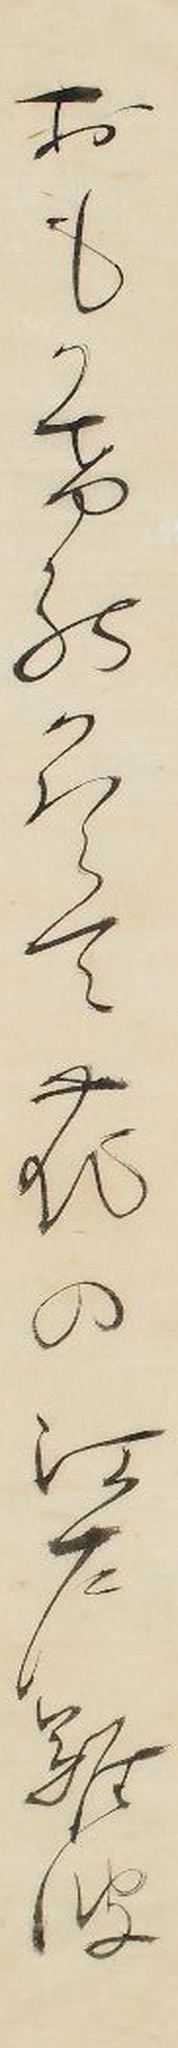おもかけのかはらて花の江戸難波
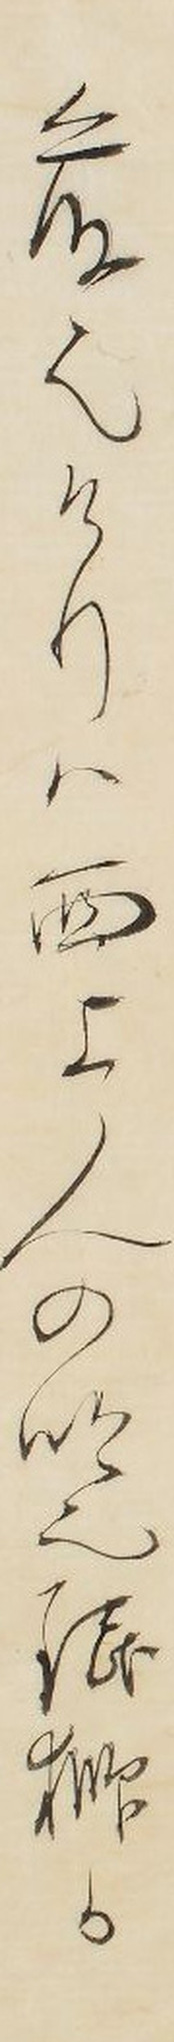兪也けりは西上人の覚珉獅か
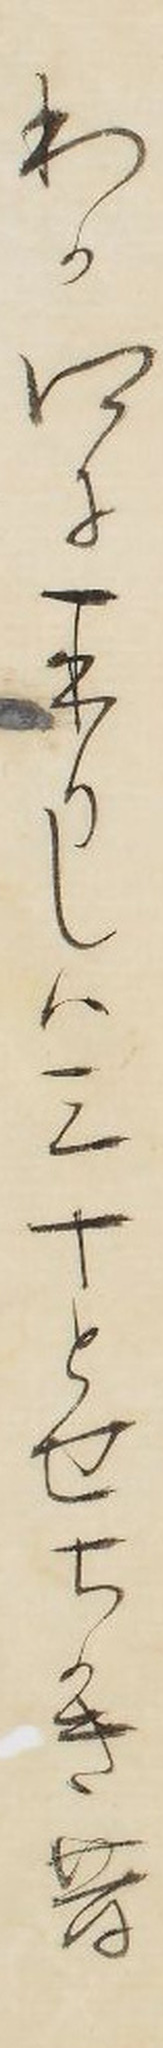わか郷に来りしは三十とせちかき昔
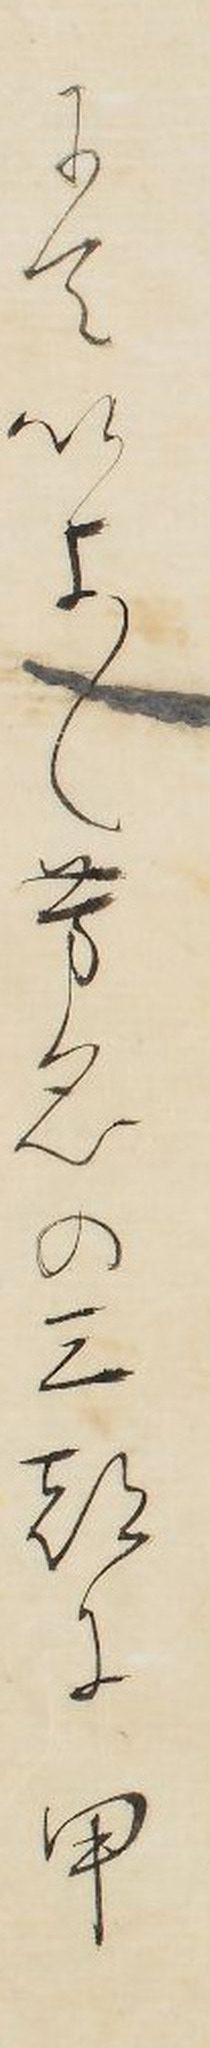にていよ〳〵芳名の三都に甲
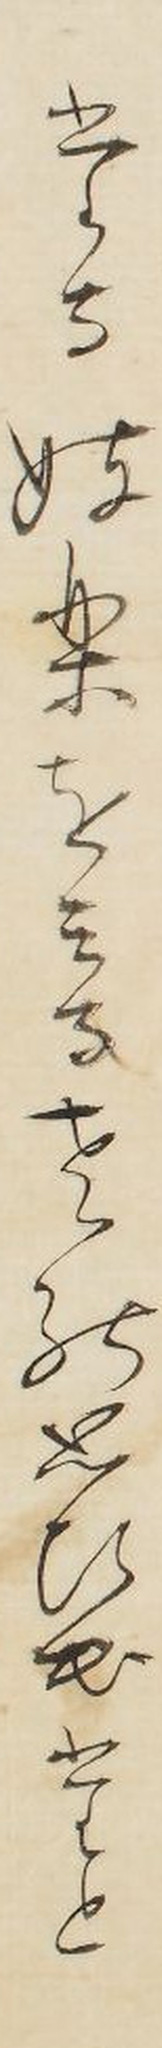堂寺妓楽をみる老の思ひ出たと
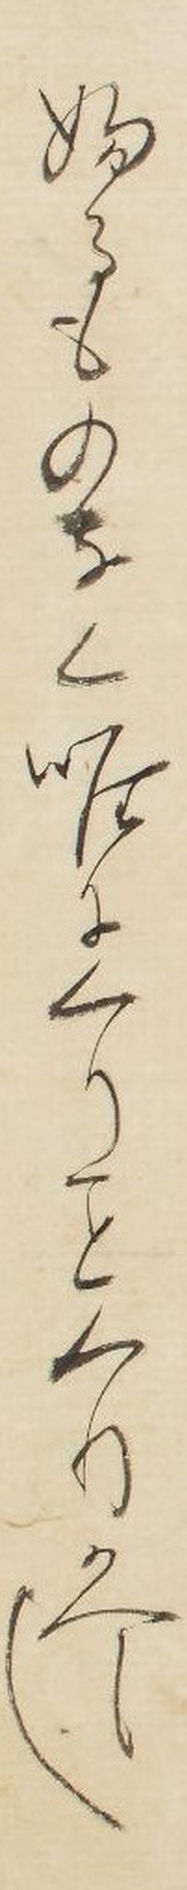ふるものなく唯にくりことくりかへしし

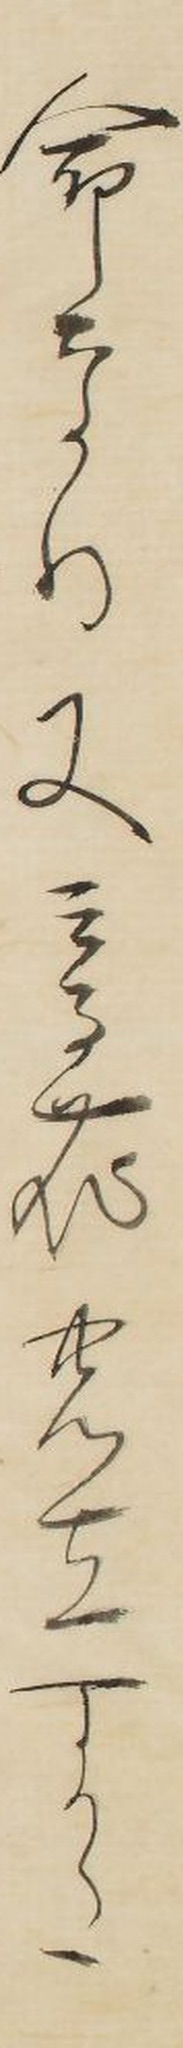命なり又みる花の立すかた
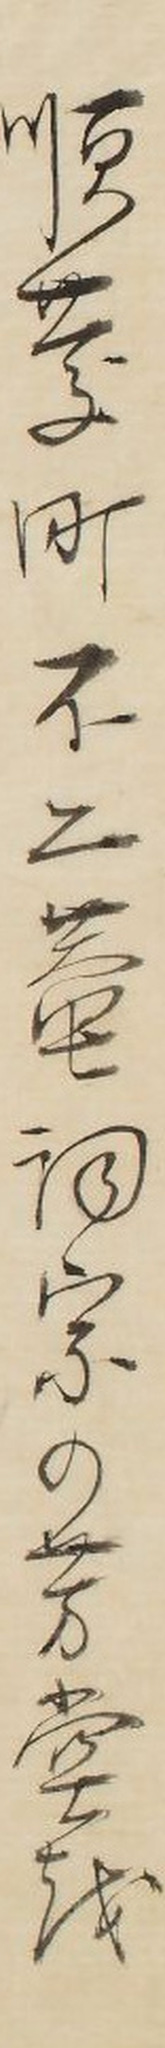順慶町不二庵詞宗の芳堂を
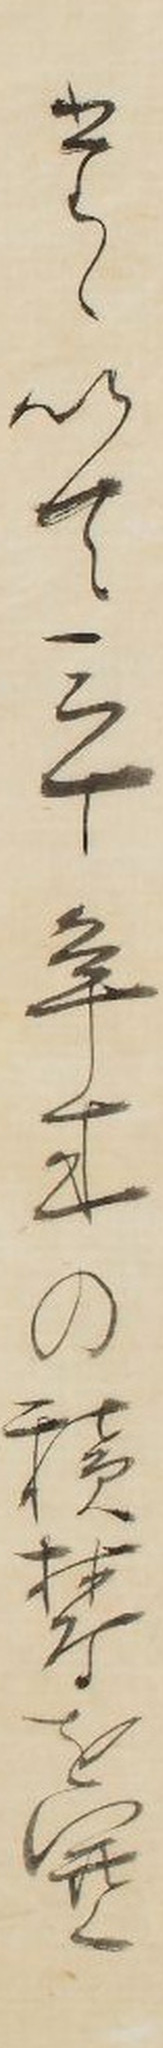たゝいて三十年来の積欝を開く
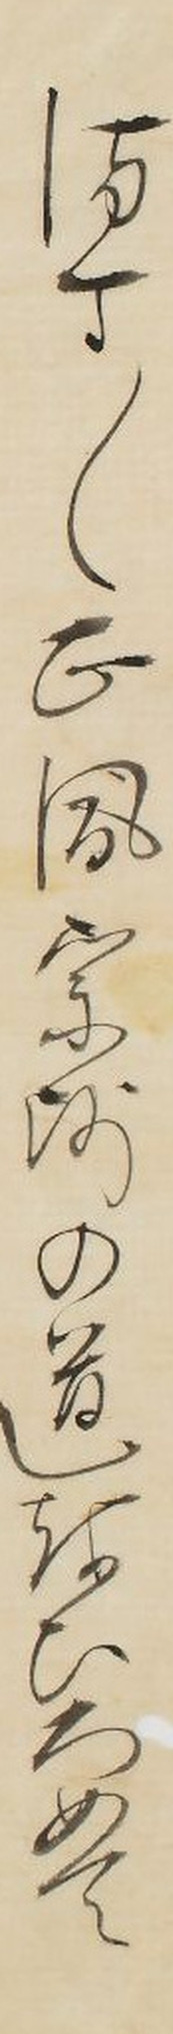ます〳〵正風宗師の道をひろめて
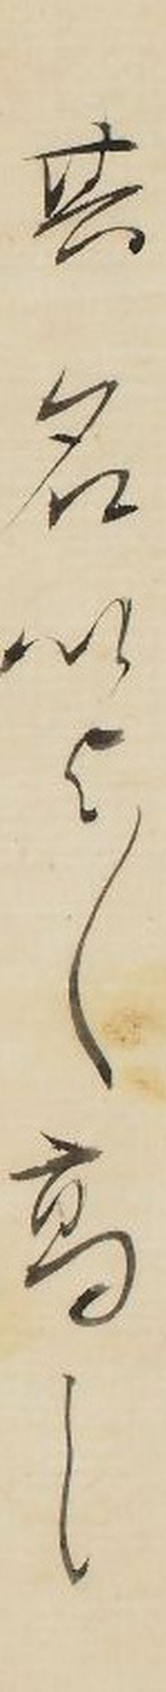其名いよ〳〵高し
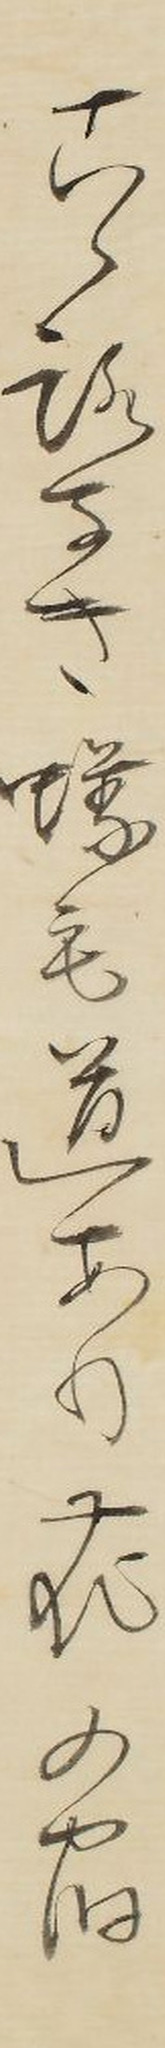こゝろなき蟻も道あり花の宿
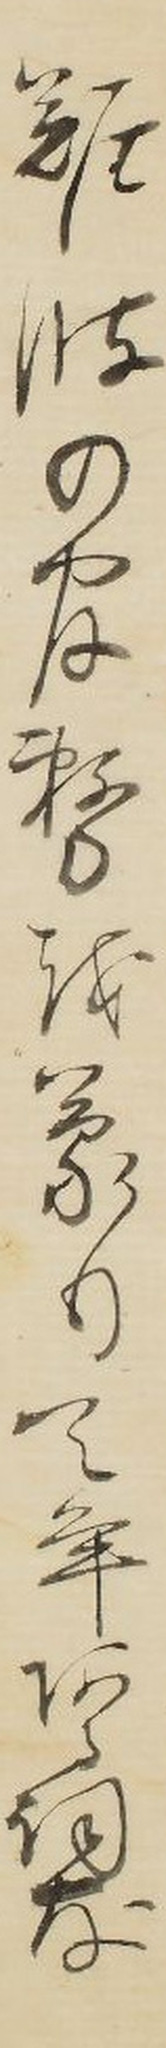難波の官務を蒙りて年ある詞友
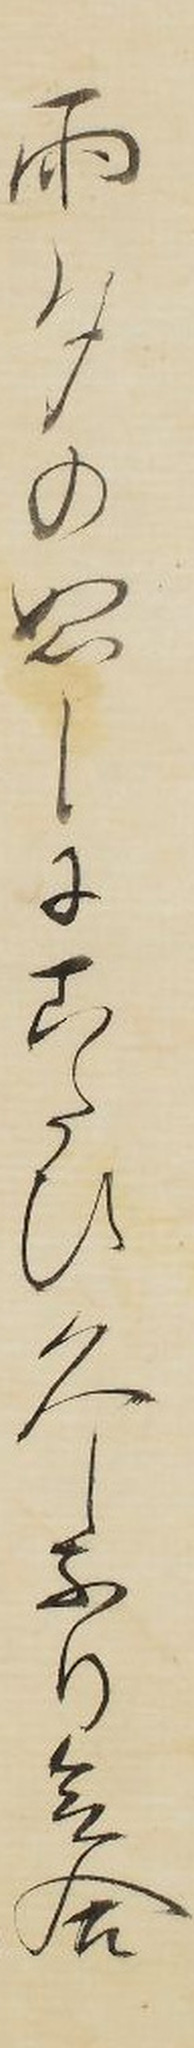雨夕のぬしにこたひ久しふり言合
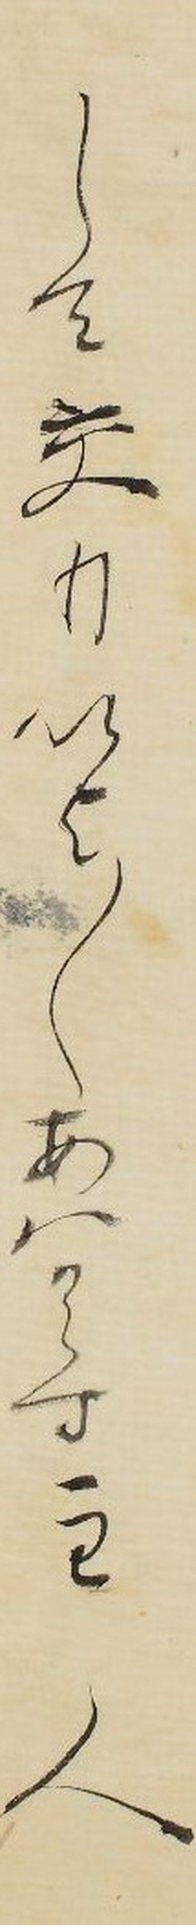して交りいよ〳〵あはからす主人
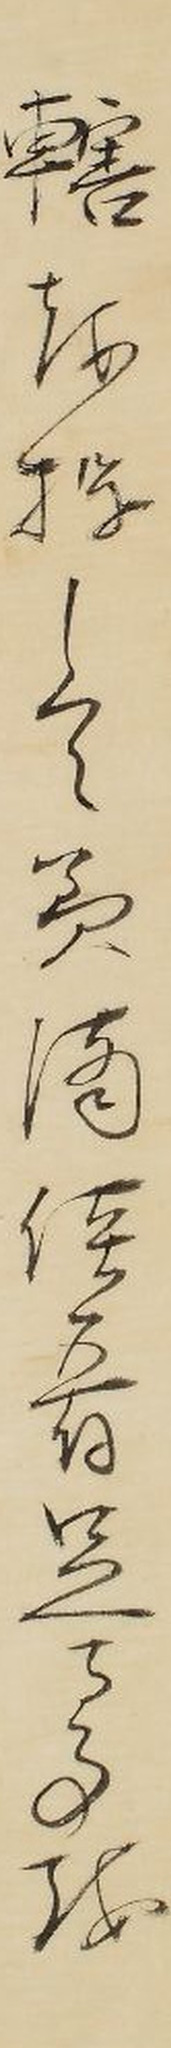轄を投して美酒佳肴足る事を
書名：花土産
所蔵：徳島県立図書館
